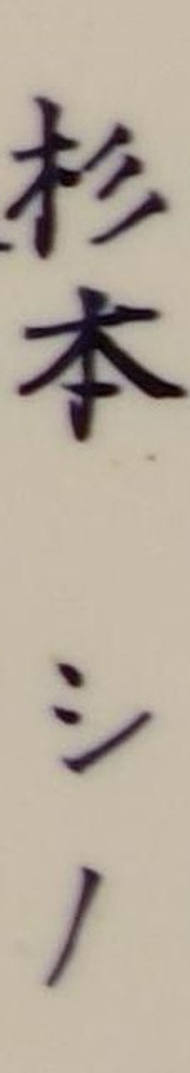杉本シノ
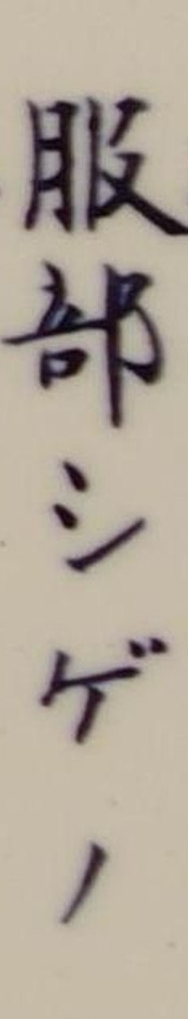服部シゲノ
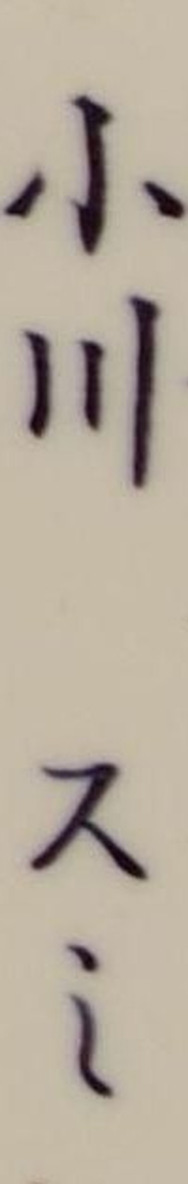小川ス之
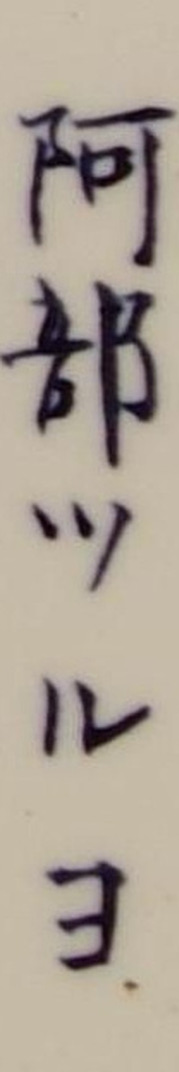阿部ツルヨ
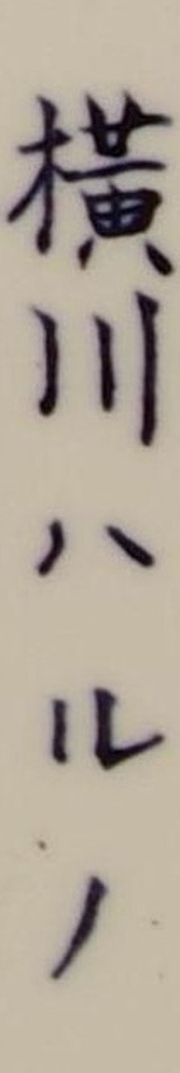横川ハルノ
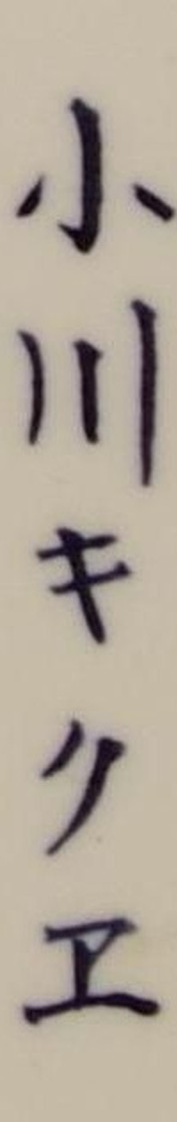小川キクヱ
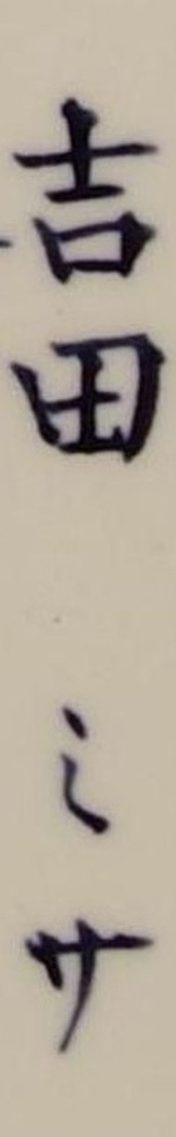吉田ミサ
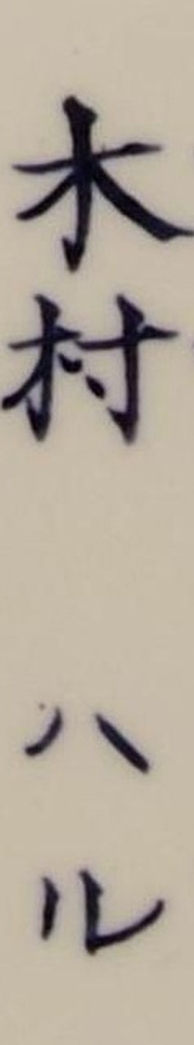木村ハル
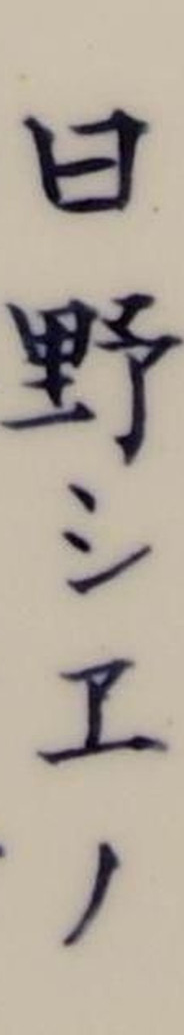日野シヱノ
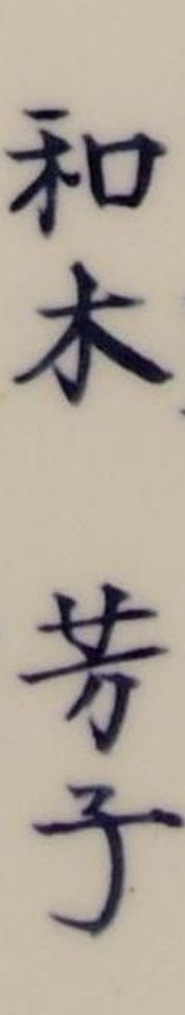和木芳子
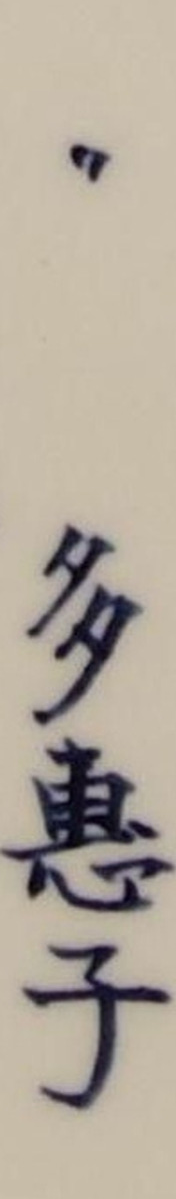多恵子
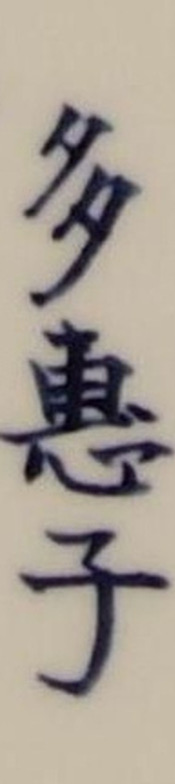多恵子
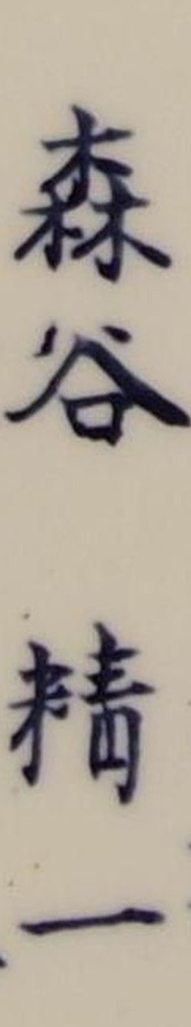森谷精一
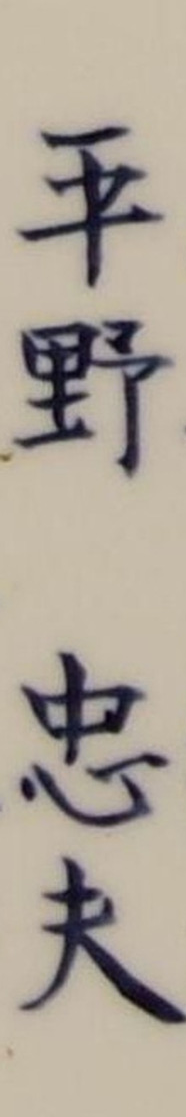平野忠夫
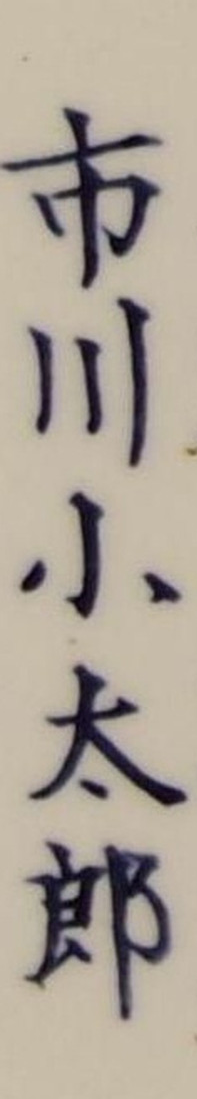市川小太郎
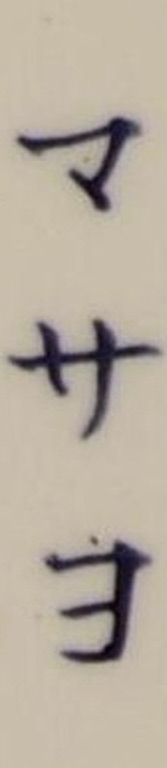マサヨ
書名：E~L
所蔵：高野山金剛峯寺
